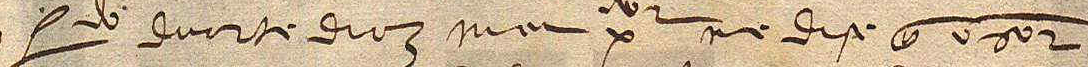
o Ldo duarte diaz meu pdor me dise q̄ o s̄or
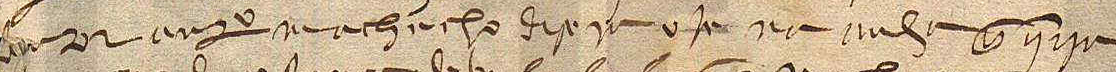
doutor anto machucho disera oJe na audja q̄ q̄rja
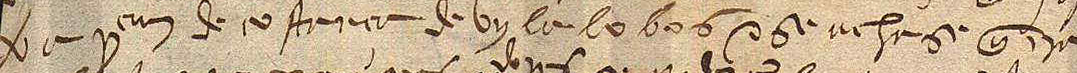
ꝟ a ꝓcam de costança de vylalobos e se achase q̄ era
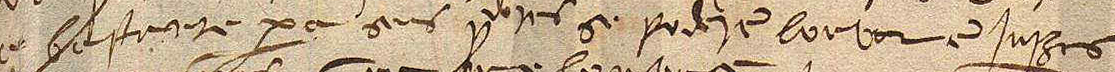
a bastante ꝑa seus ꝓdores se poderē louvar ē Jujzes
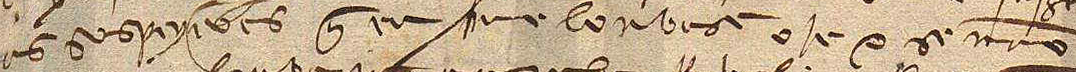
as sospeyções q̄ eu me louvase oJe e se não
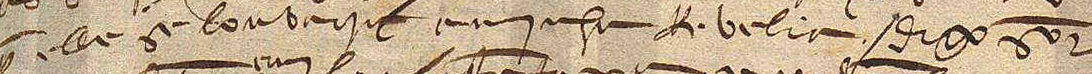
q̄ elle se louvarja a mjnha Revelia ./ digo s̄or
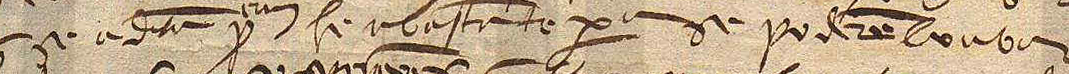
q̄ se a dita ꝓcam he a bastāte ꝓa se podēre louvar
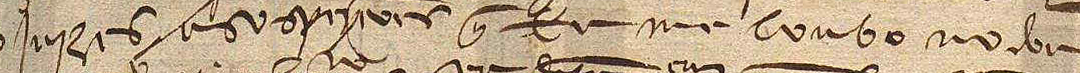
ē Juijzes a sospeyções q̄ Eu me louvo no dou
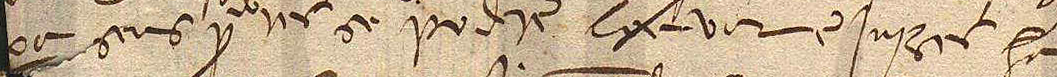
ꝑa seus ꝓdores se poderē louvar ē Jujzes ha
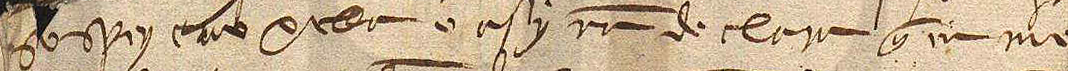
sospeycao e ella o asy n̄a declara q̄ eu me
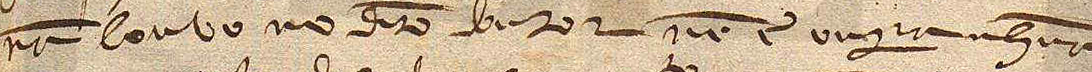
n̄a louvo no dito doutor n̄e ē outra nhūa
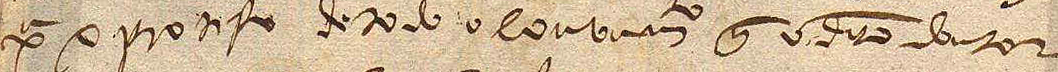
pa e protesto de todo o louvamto q̄ o dito doutor
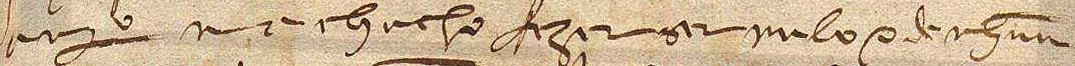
anto machucho fezer ser nulo e de nhūu
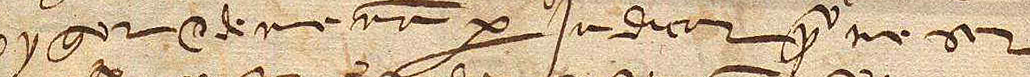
vygor e de me n̄a ꝑJudicar p̄o me ser
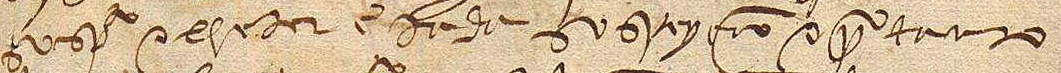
sospto e lhe ter ē tada sospeyção e p̄otanto
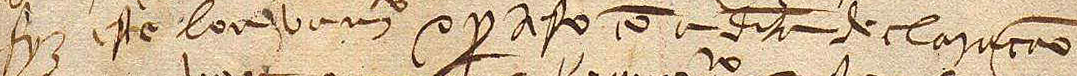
fyz este louvamto e ꝓtesto c̄o a dita declaração
